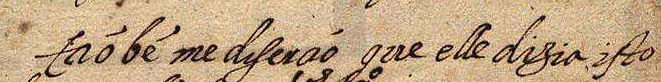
taõbē me diseraõ que elle dizia isto
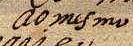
ao mesmo
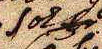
soltro
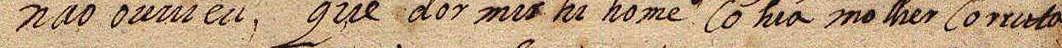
naõ ouui eu, que dormir hū homē cō huā molher corruta
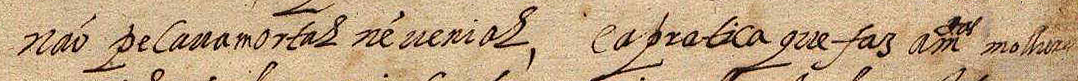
naõ pecaua mortal nē uenial, e a pratica que faz a mtas molhere
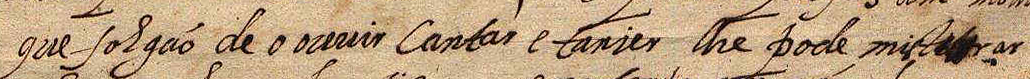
que folgaõ de o ouuir cantar e tanier lhe pode misturar
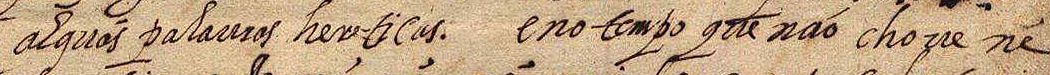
alguās palauras hereticas. e no tempo que naõ choue nē
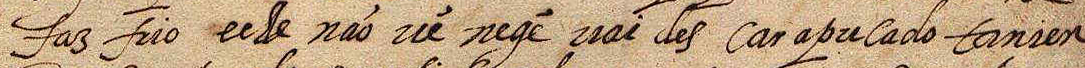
faz frio e elle naõ uē negē uai descarapuçado tanien
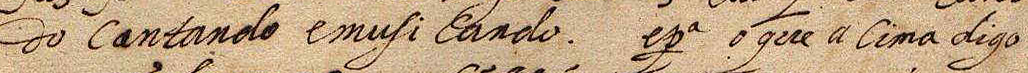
do cantando e musicando. e ꝑa o que acima digo
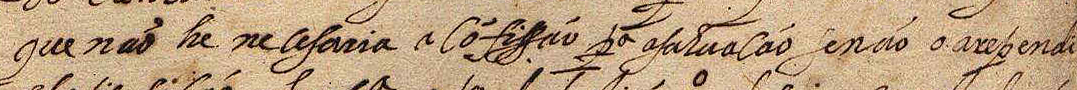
que naõ he necesaria a cōfissaõ ꝑa a saluaçaõ senão o arependi
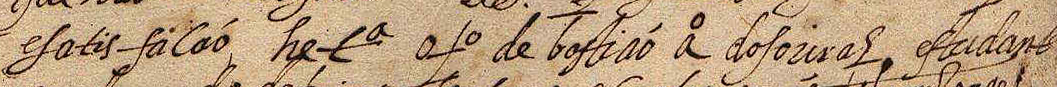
e satisfaçaõ he ta o fo de bastiaõ ao do soural, estudante
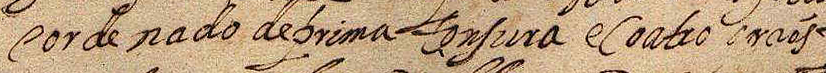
e ordenado de prima tonsura e Coatro graos̄
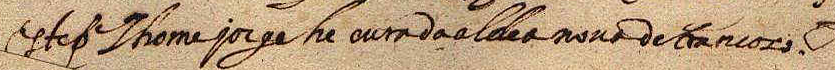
este pe Thome jorge he cura da aldea noua de trancozo
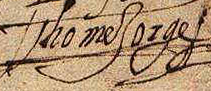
Thome Jorge
